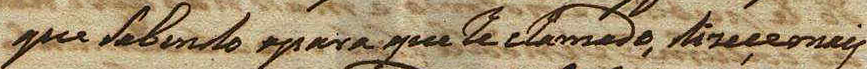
que sabendo o para que he chamado, dizece mais
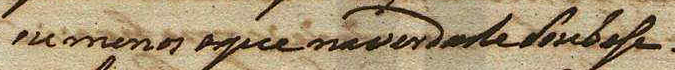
ou menos o que na verdade soubese
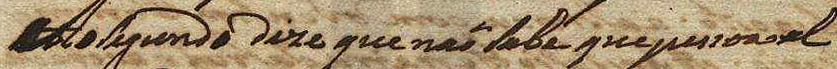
Ao segundo dize que naõ sabe que pessoa al
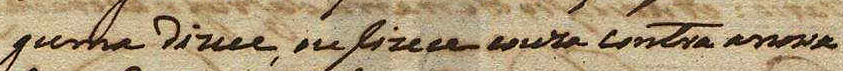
guma dizece, ou fizece couza contra a nossa
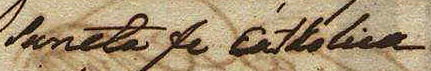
sancta fe catholica
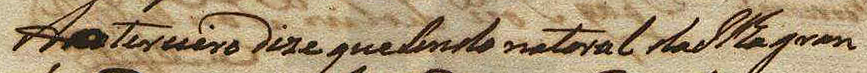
Ao terceiro dize que sendo natoral da Ilha gran
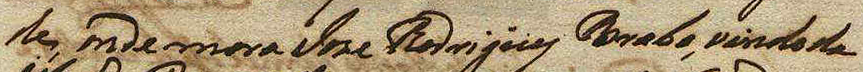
de, onde mora Ioze Rodrigues Brabo, vindo da
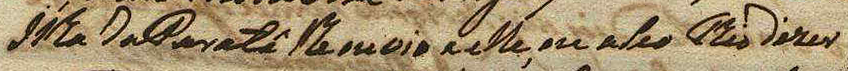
Ilha da Paratá lhe ouvio a elle, ou a seo Thio dizer
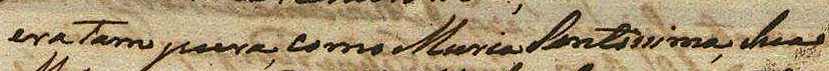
era tam pura, como Maria santissima sua
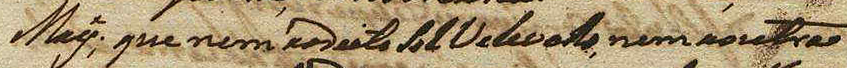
May; que nem ao dicto sol Velevado, nem a outra
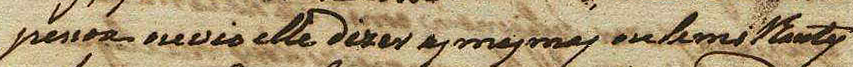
pessoa ouvio elle dizer as mesmas ou semilhantes
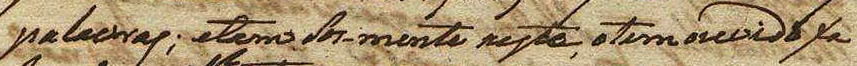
palavras; e tem sosmente nesta, o tem ouvido fa
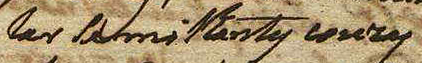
lar semilhantes couzas
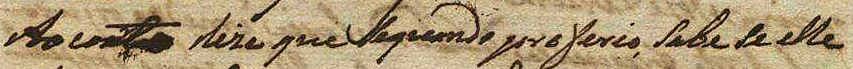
Ao corto dize que se quando proferio, sabe se elle
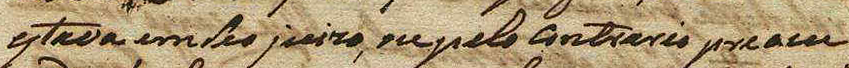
estava em seo juizo, ou pelo contrario preocu
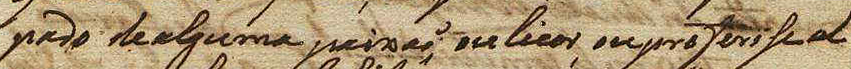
pado de alguma paixaõ, ou licor, ou proferise al
